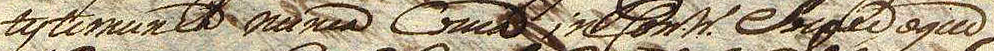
testemunha nunca Cousa in Contr.o Soube, o que
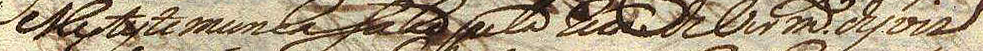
elle testemunha sabe pela Rezão de Vir m.to depoiz,
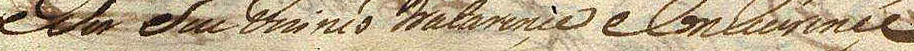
e Ser Seu visinho tratarençe e Conhecerençe
